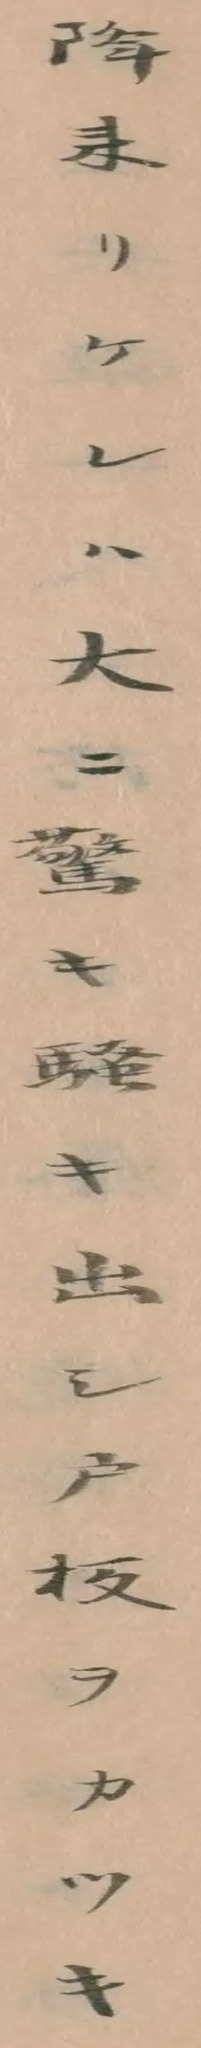降来りケレハ大二驚キ騒キ出シ戸板ヲカツキ
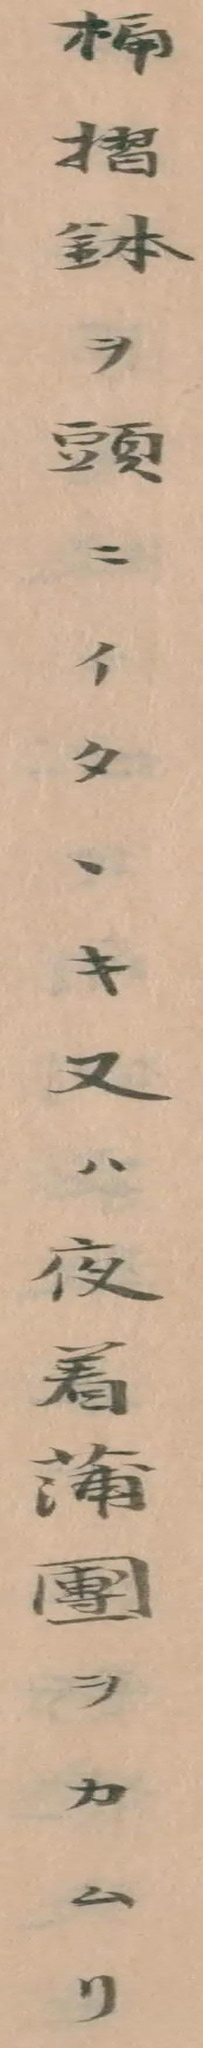桶摺鉢ヲ頭二イタゝキ又ハ夜着蒲団ヲカムリ
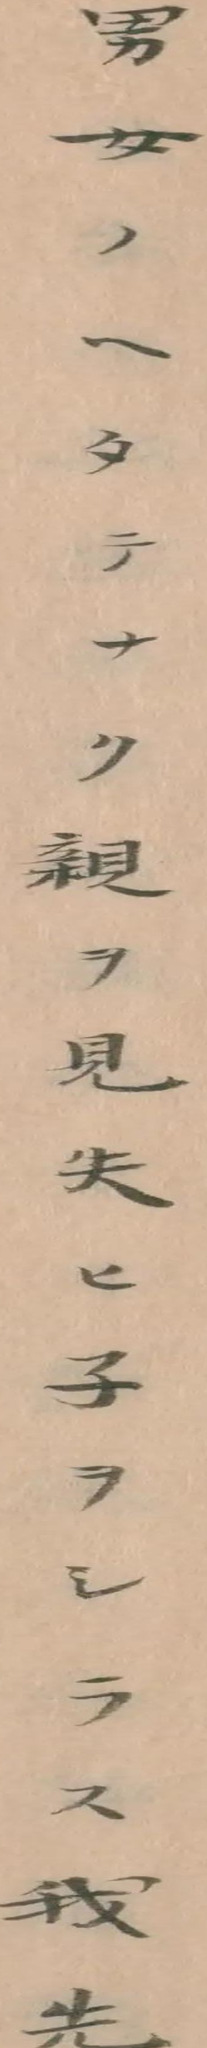男女ノヘタテナク親ヲ見失ヒ子ヲシラス我先
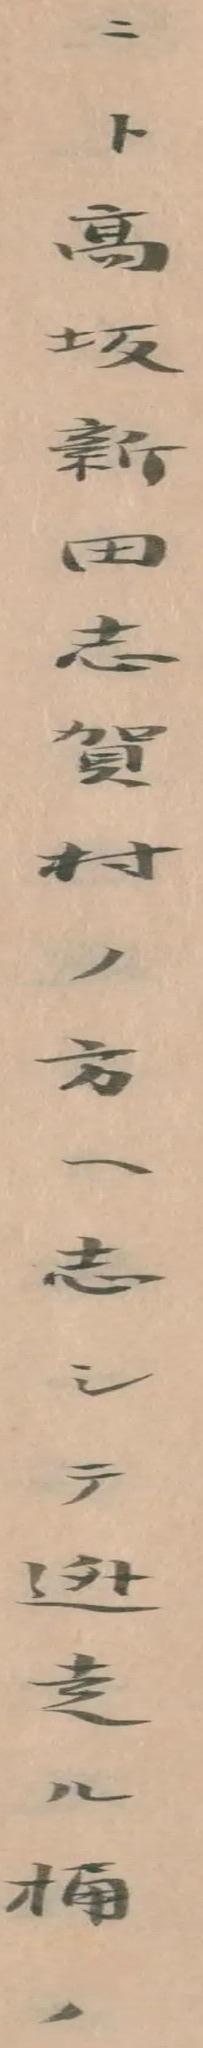ニト高坂新田志賀村ノ方へ志シテ逃走ル桶ノ
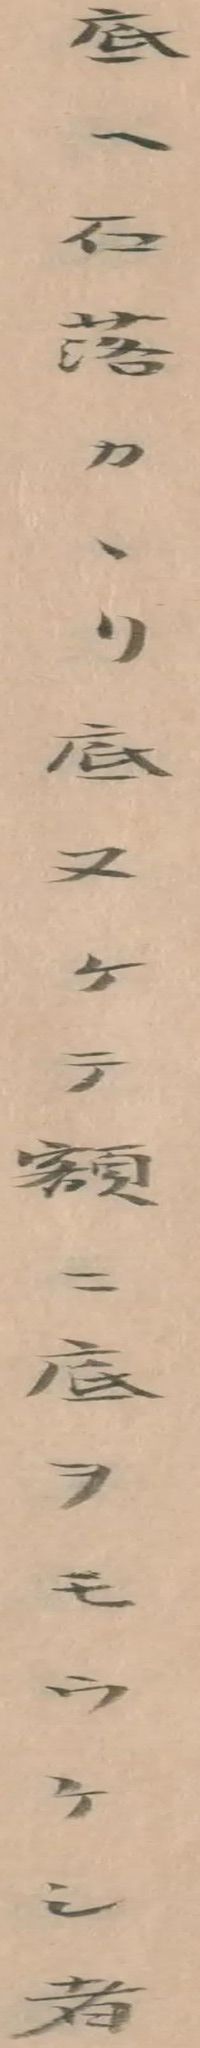底へ石落カゝリ底ヌケテ額二底ヲモウケシ者
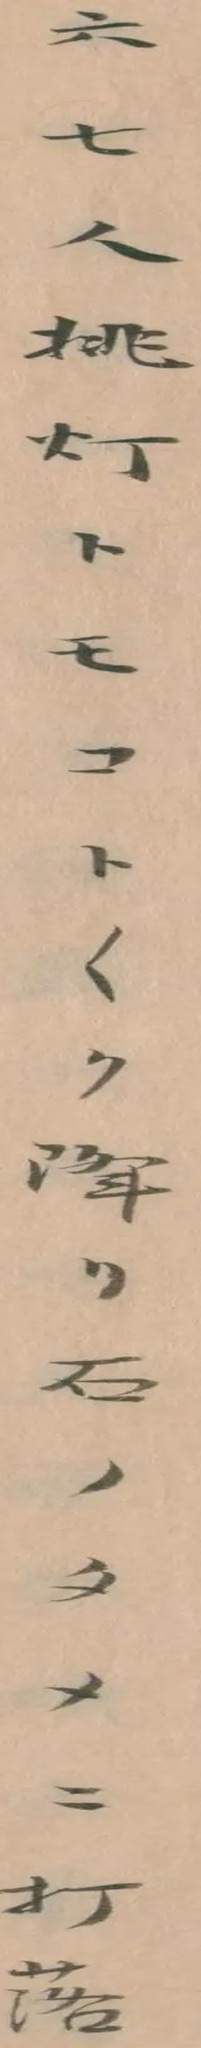六七人挑灯トモコト〳〵ク降り石ノタメニ打落

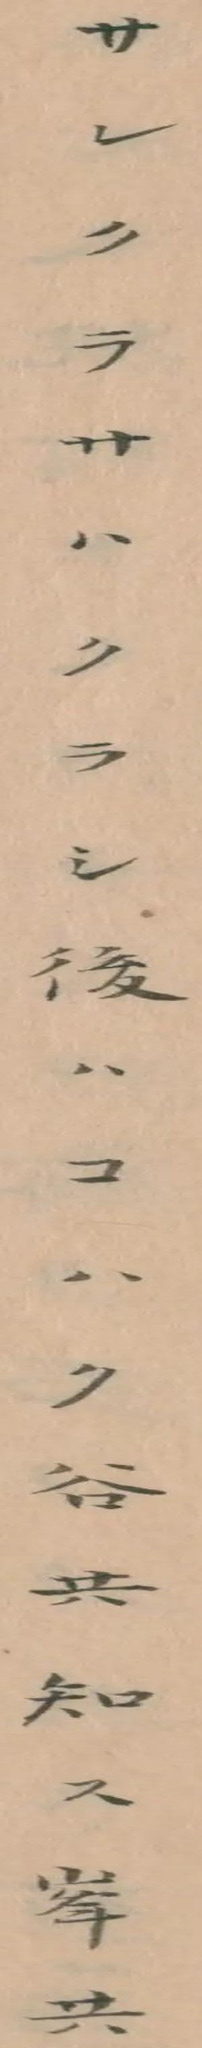サレクラサハクラシ後ハコハク谷共知ス峯共
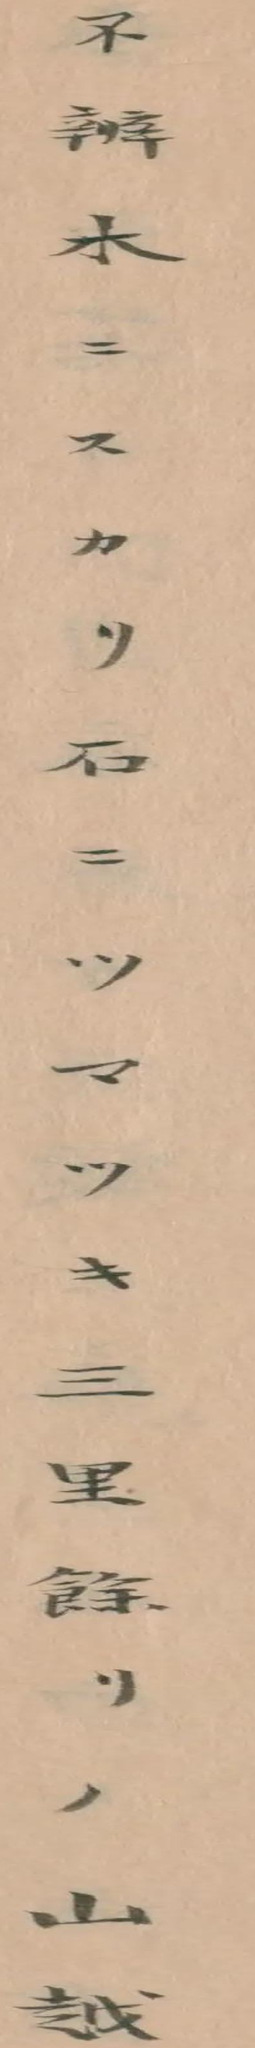不辨水二スカリ石二ツマツキ三里余りノ山越
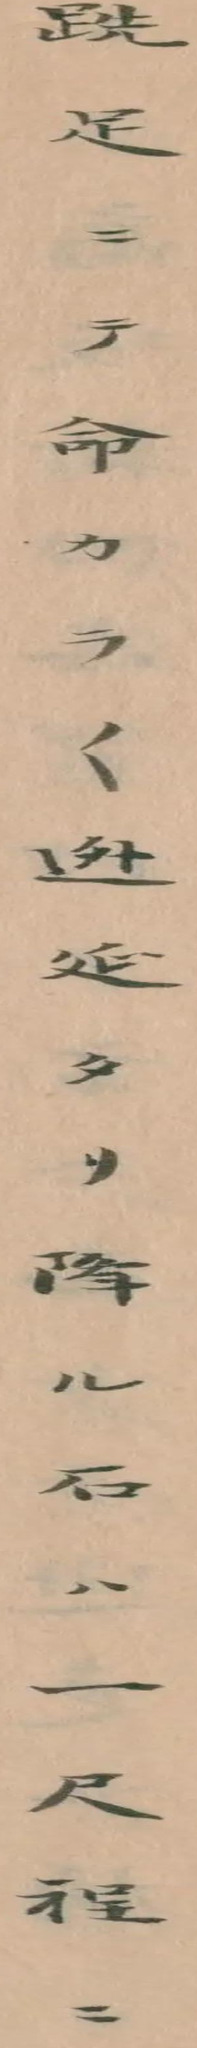跣足ニテ命カラ〳〵逃延タリ降るル石ハ尺程二
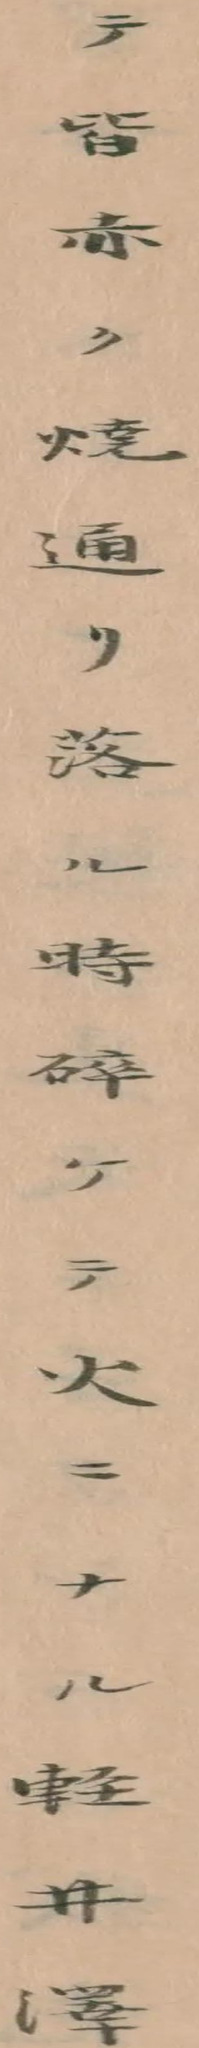テ皆赤ク焼通り落ル時砕ケテ火二ナル軽井沢
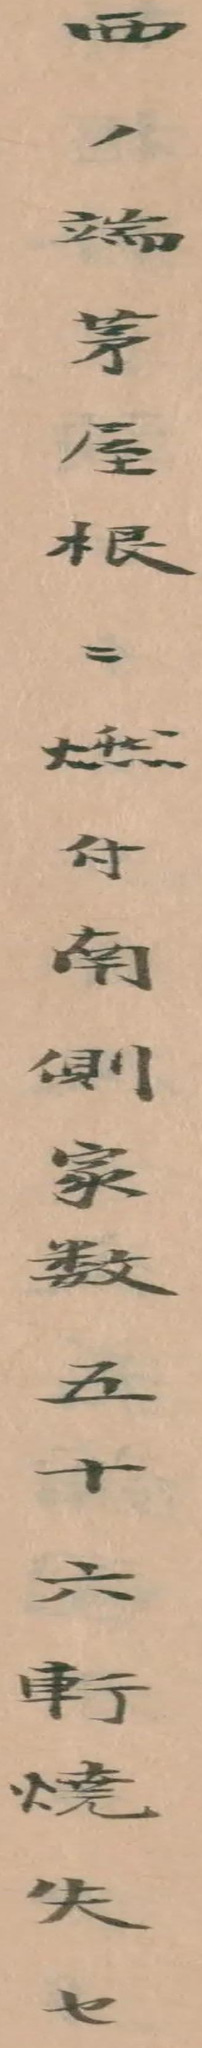西ノ端茅屋根二燃付南側家数五十六軒焼失セ
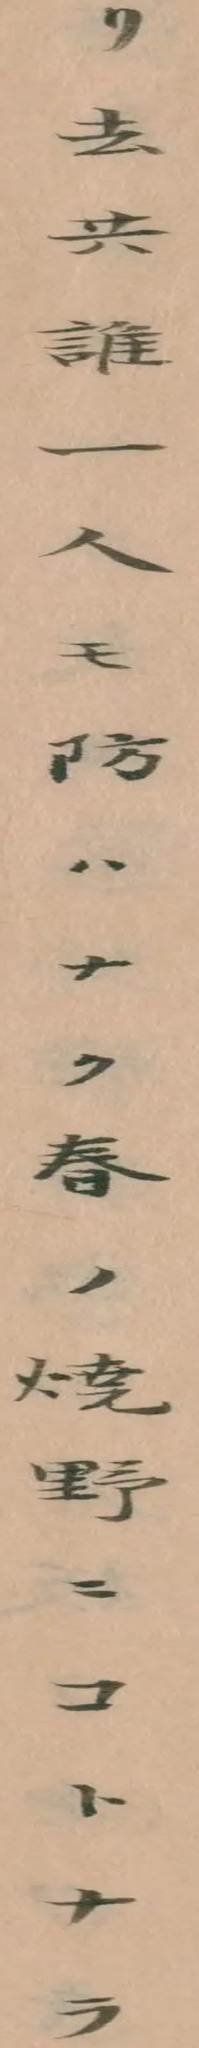り去共誰一人モ防ハナク春ノ焼野二コトナラ
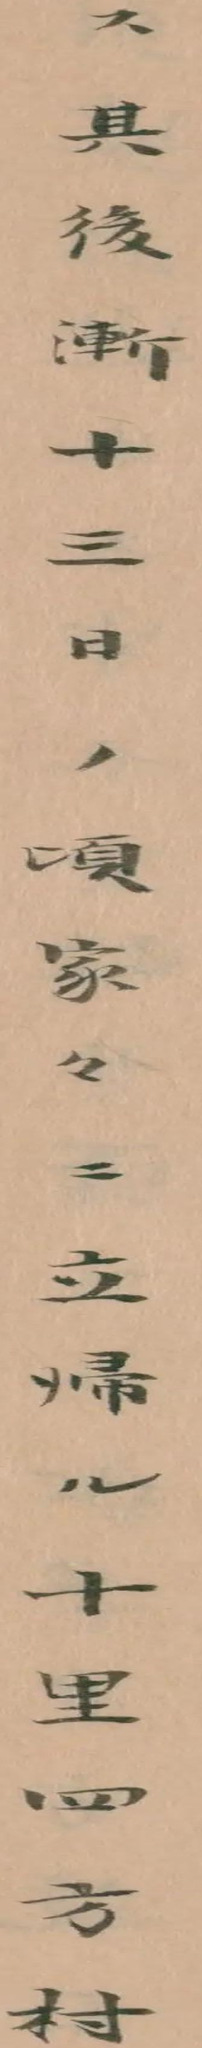ス其後漸十三日ノ頃家々二立帰ル十里四方村
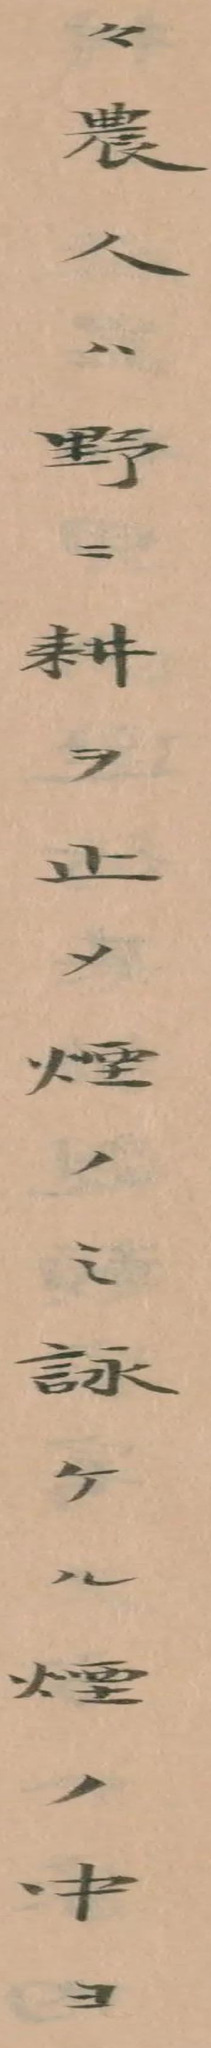々農人ハ野二耕ヲ止メ煙ノミ詠ケル煙ノ中ヨ
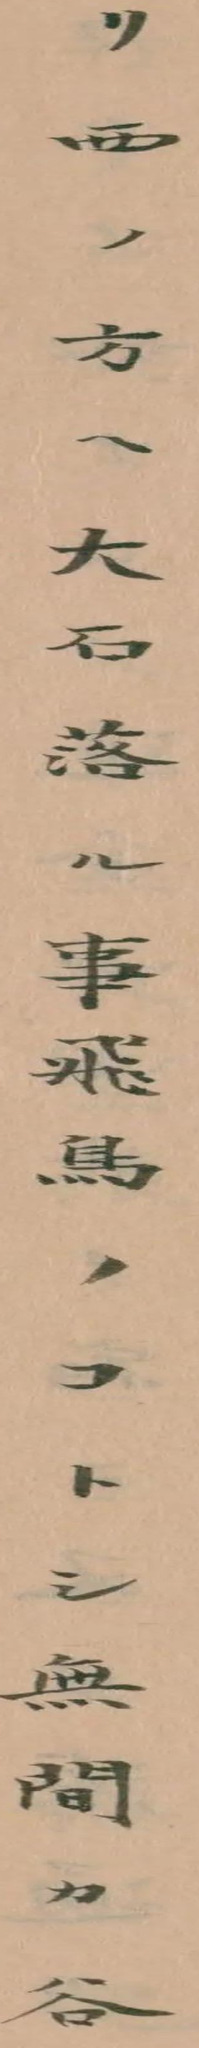リ西ノ方へ大石落ル事飛鳥ノコトシ無間ヵ谷
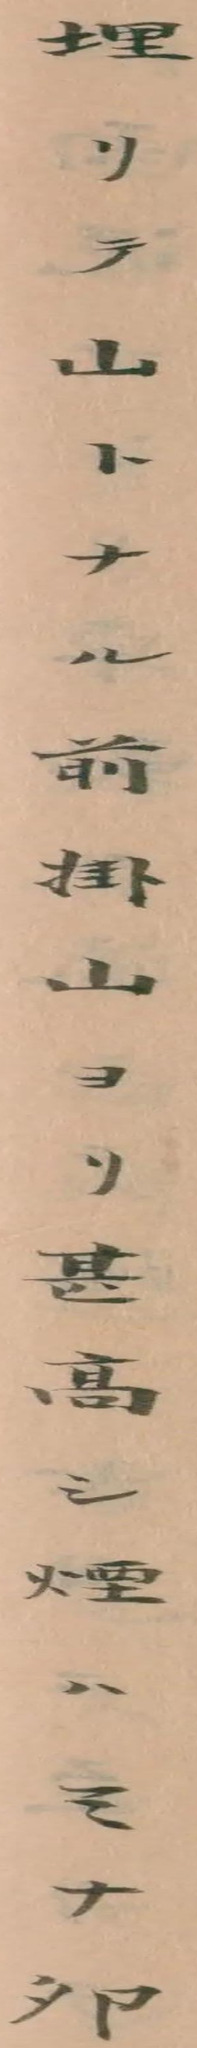埋リテ山トナル前掛山ヨリ其髙シ煙ハミナ卯
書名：地災撮要. 巻3(地震之部)-巻4(噴火之部)
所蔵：国立国会図書館 National Diet Library, JAPAN
